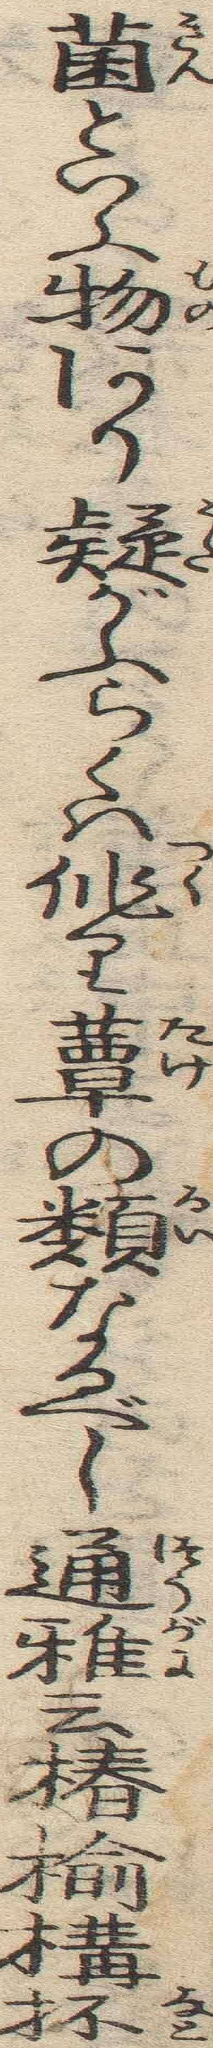菌といふ物あり疑がふらくは作り蕈の類なるべし通雅云椿榆構抔
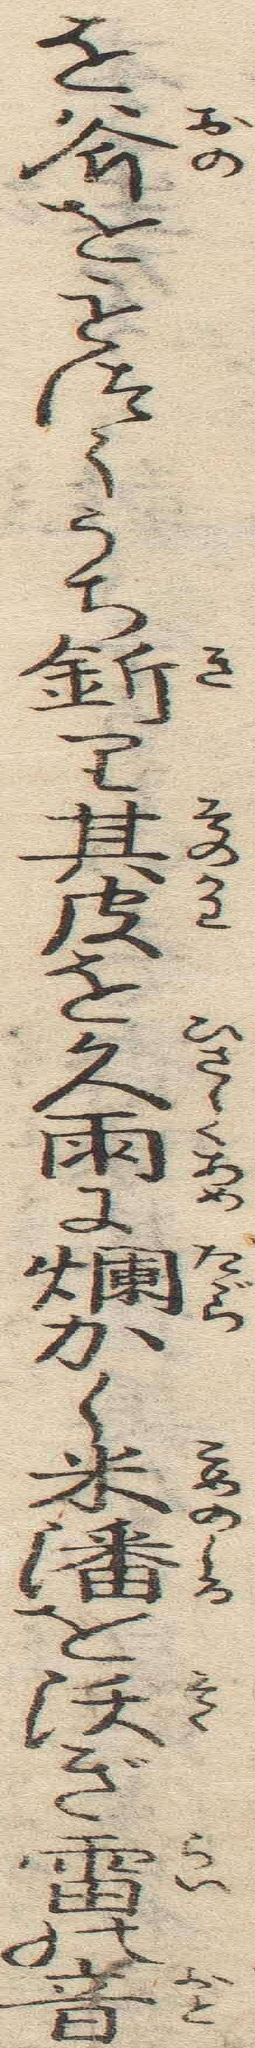を斧をもつてうち釿り其皮を久雨に爛かし米潘を沃ぎ雷の音
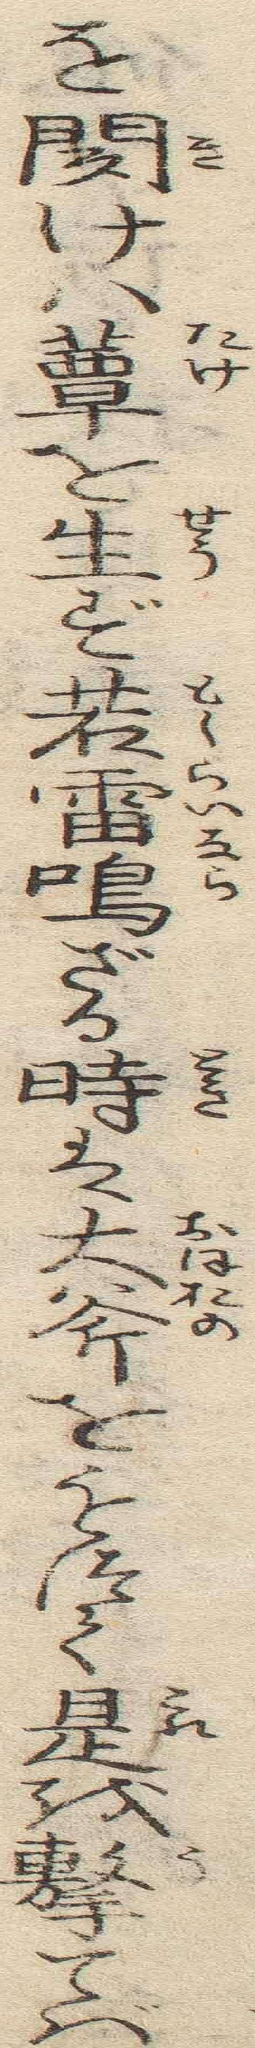を聞けは蕈を生ず若雷鳴ざる時は大斧をもつて是を撃てば
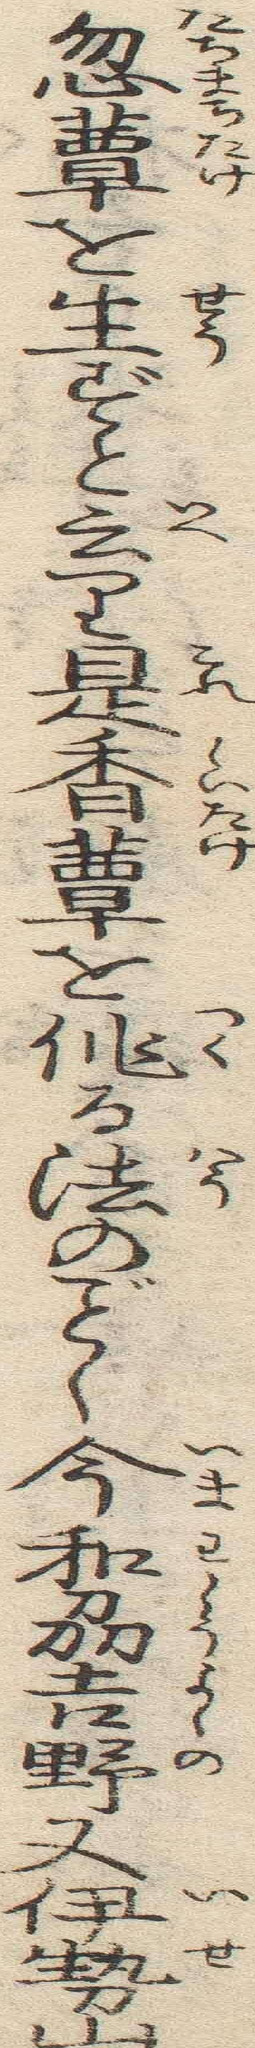忽蕈を生ずと云り是香蕈を作る法のごとし今和州吉野又伊勢山
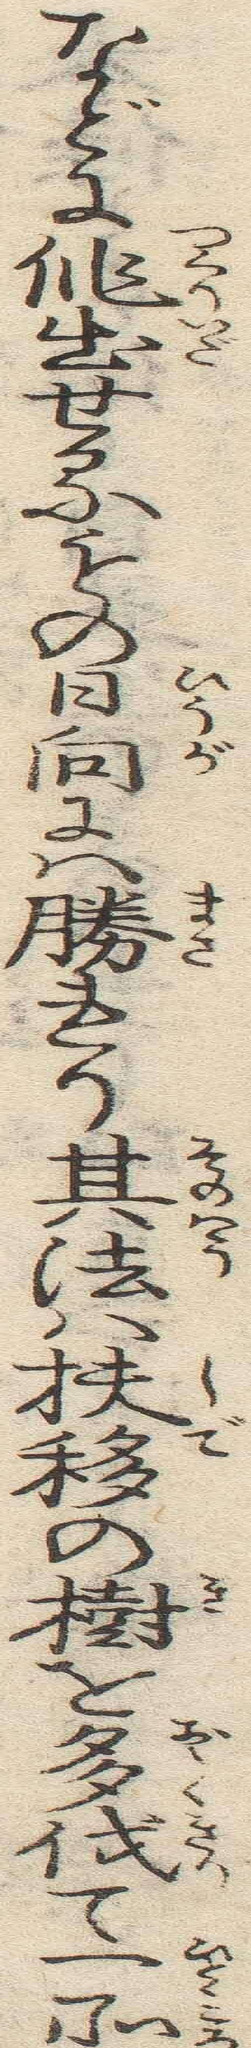などに作出せるもの日向には勝れり其法は扶移の樹を多伐て一所
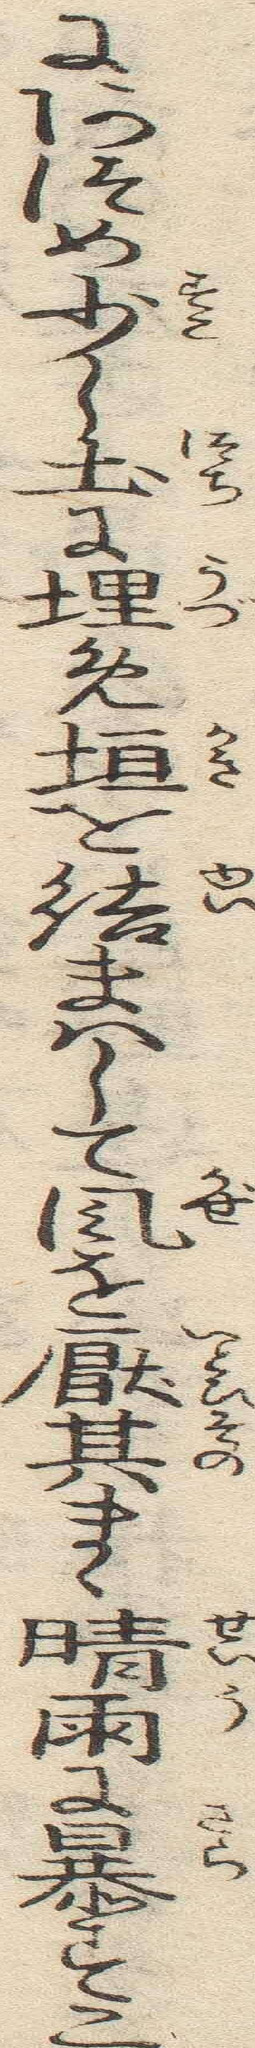にあつめ少し土に埋め垣を結まはして風を厭其まゝ晴雨に暴すこ
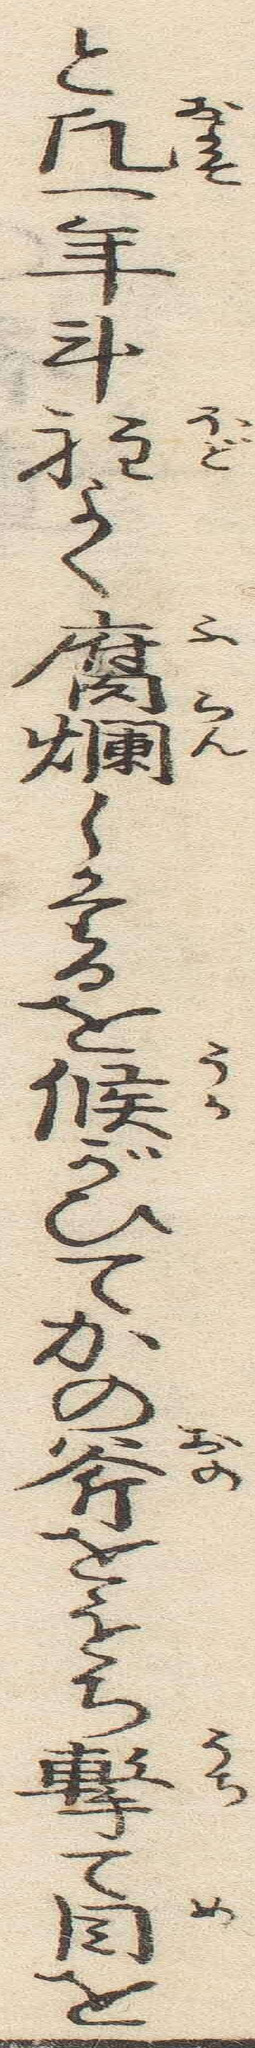と凡一年斗程よく腐爛したるを候がひてかの斧をもち撃て目を
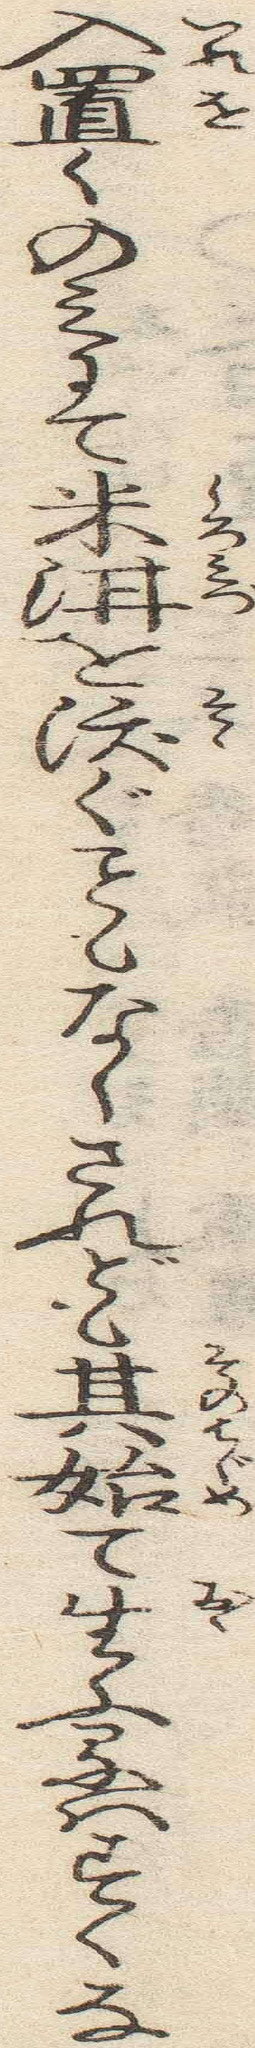入置くのみにて米泔を沃ぐこともなしされども其始て生ふるはすくな
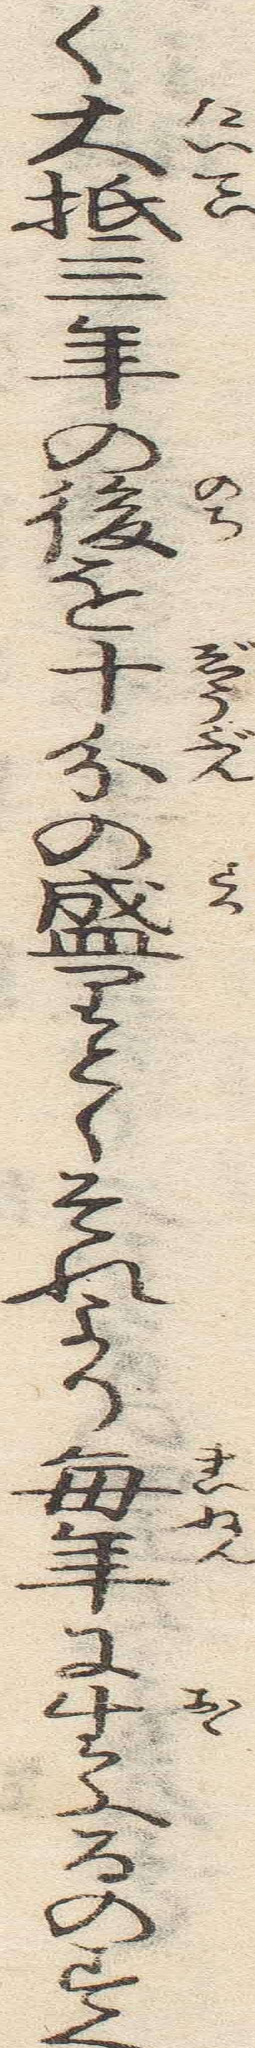く大抵三年の後を十分の盛りとしそれより毎年に生ふるのすく
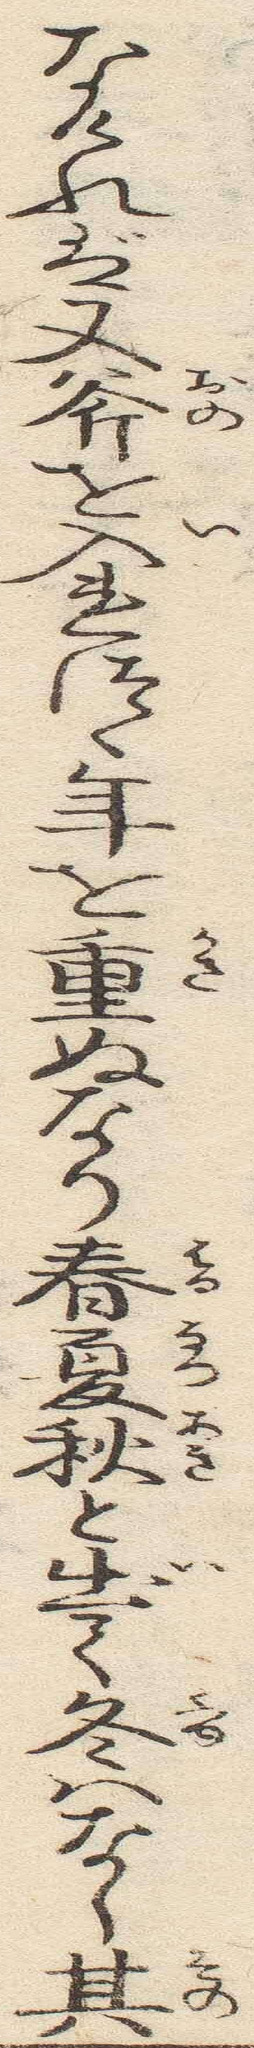なければ又斧を入れつゝ年を重ぬなり春夏秋と出て冬はなし其
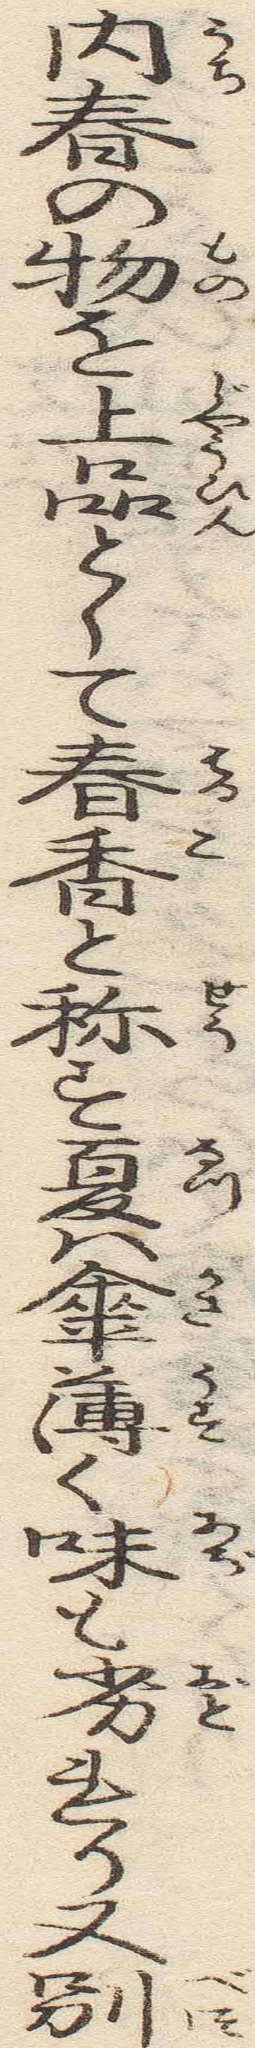内春の物を上品として春香と称す夏は傘薄く味も劣れり又別
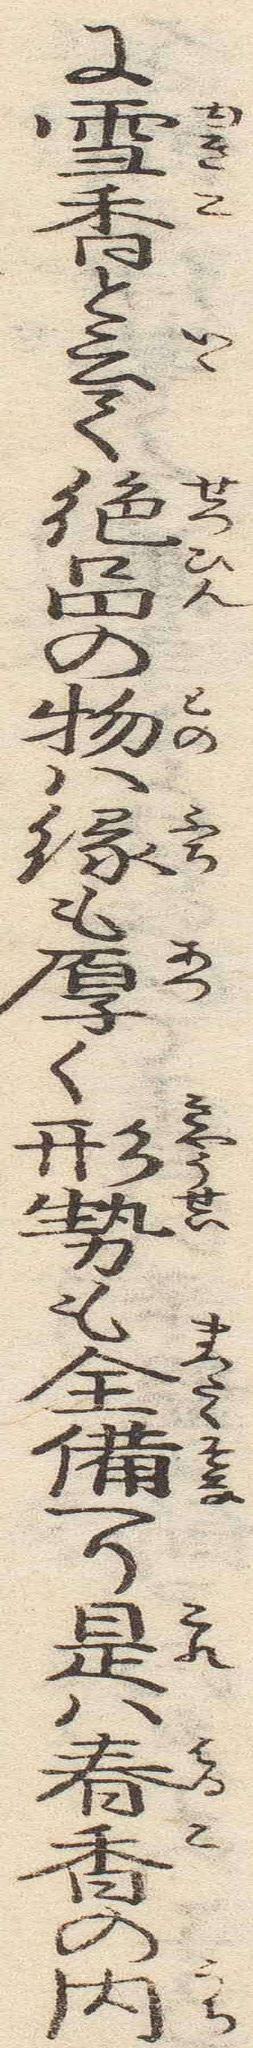に雪香と云て絶品の物は縁も厚く形勢も全備へり是は春香の内
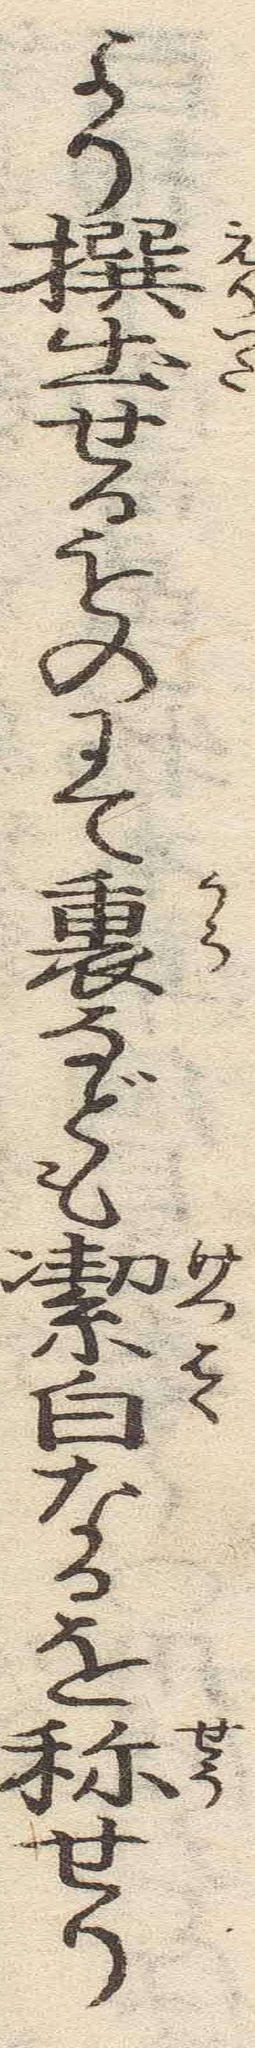より撰出せるものにて裏なども潔白なるを称せり
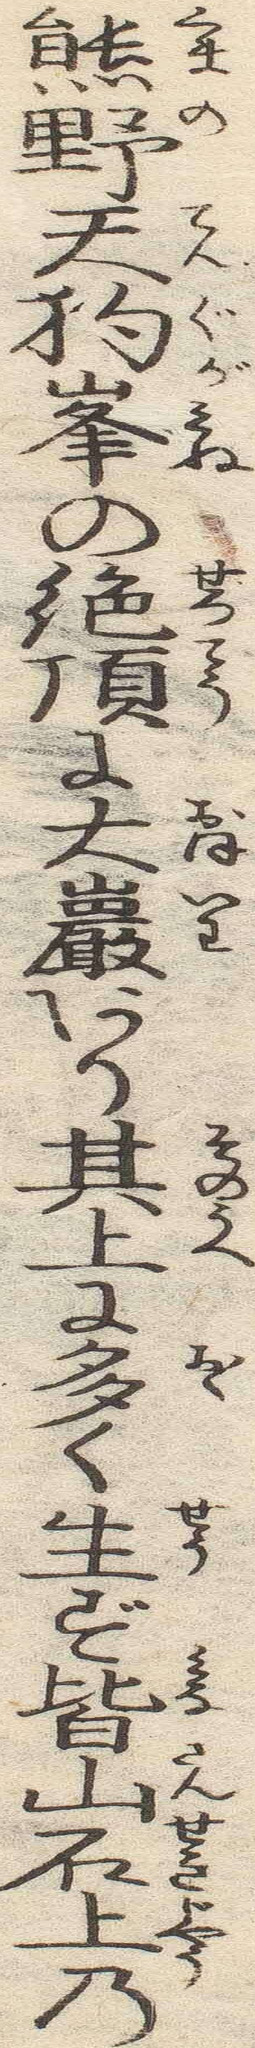熊野天狗峯の絶頂に大巌あり其上に多く生ず皆山石上の
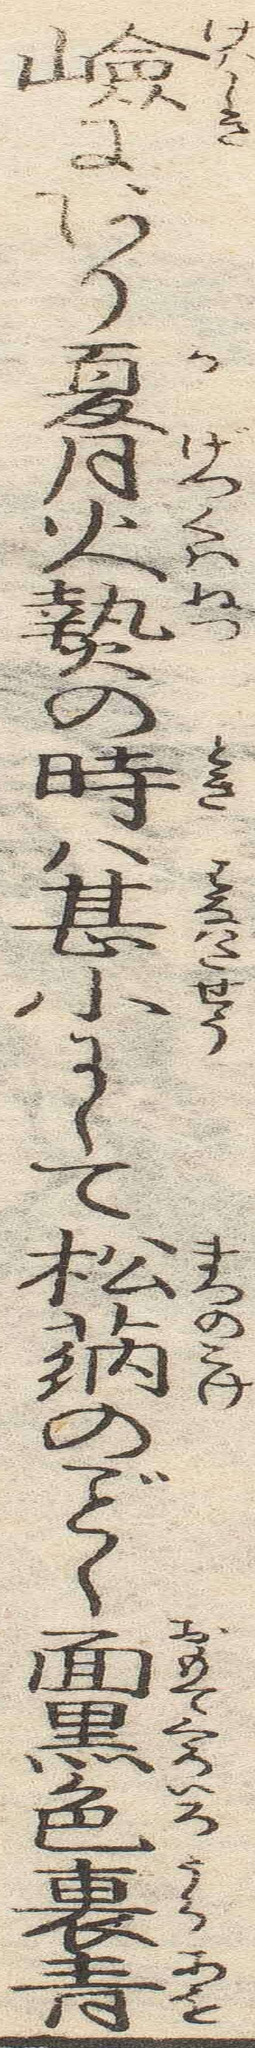嶮にあり夏月火熱の時は甚小にして松蒳のごとし面黒色裏青
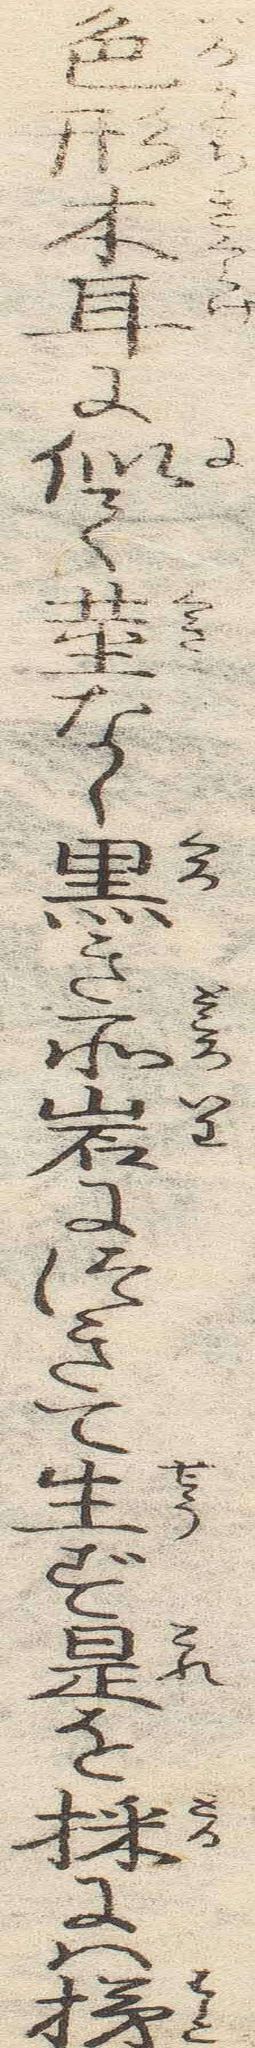色形木耳に似て茎なし黒き所岩につきて生ず是を採には梯
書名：日本山海名産図会
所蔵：東京学芸大学附属図書館 国文学研究資料館
